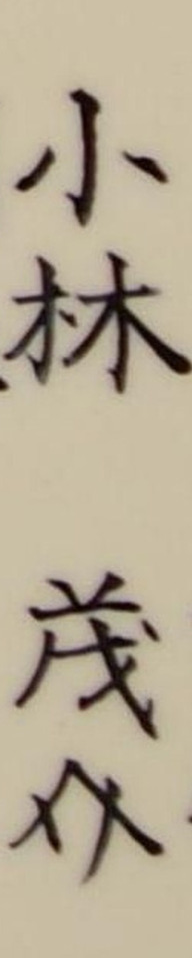小林茂介
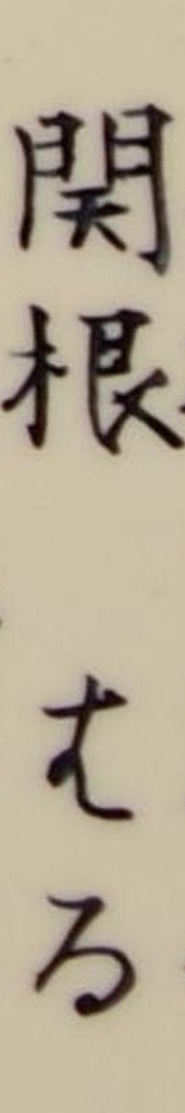関根はる
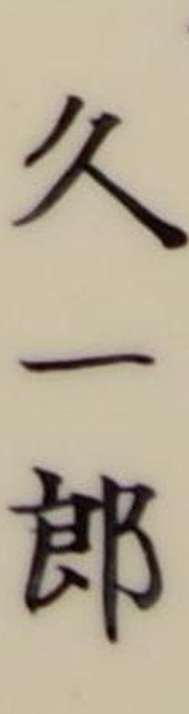久一郎
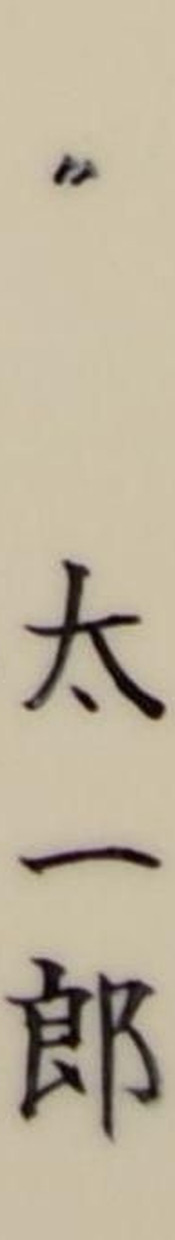太一郎
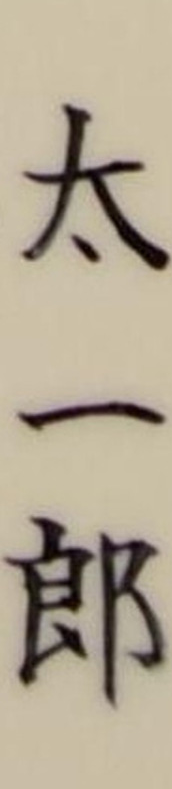太一郎
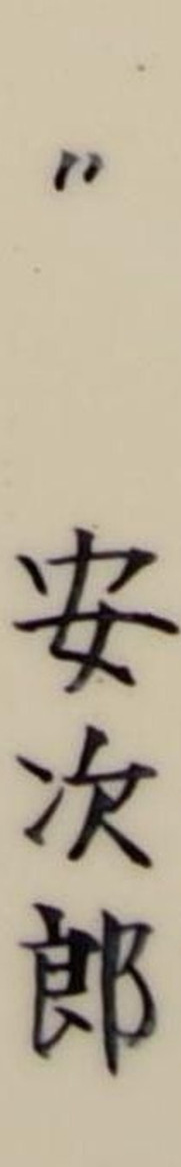安次郎
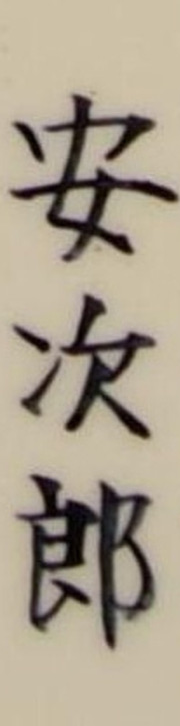安次郎
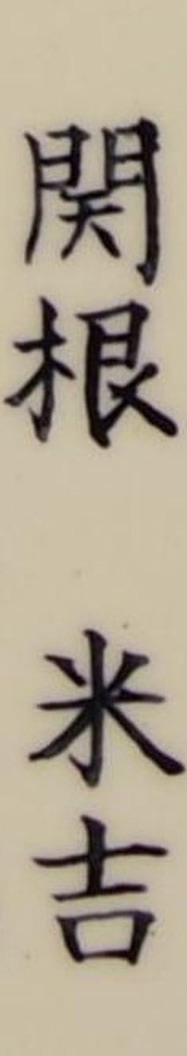関根米吉
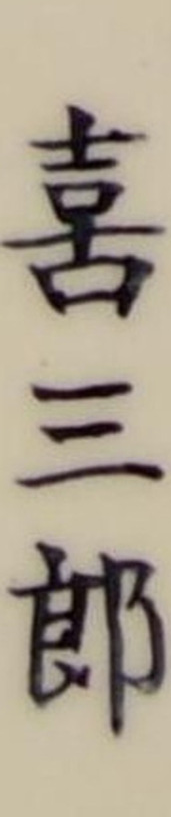喜三郎
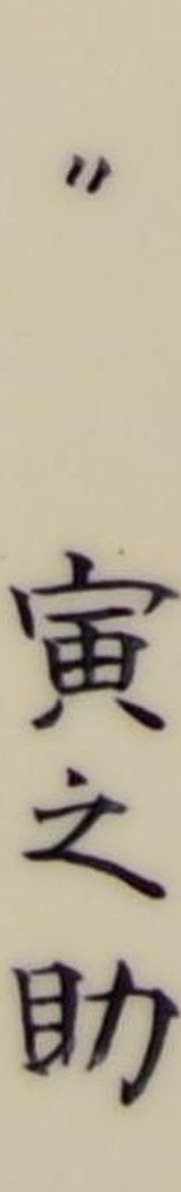寅之助
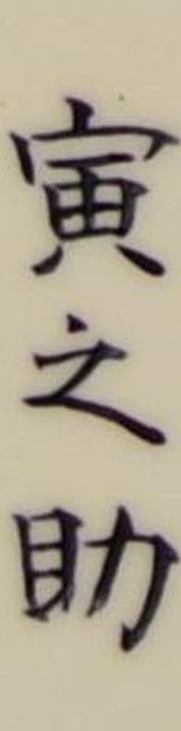寅之助
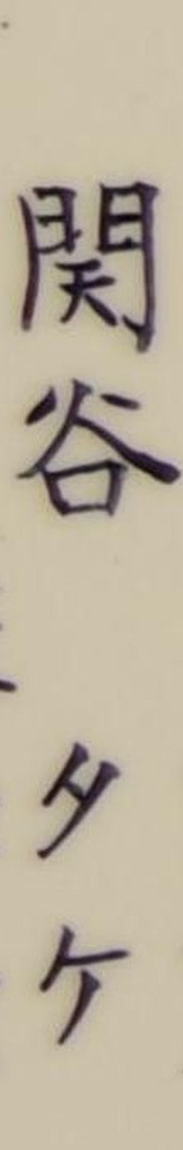関谷タケ
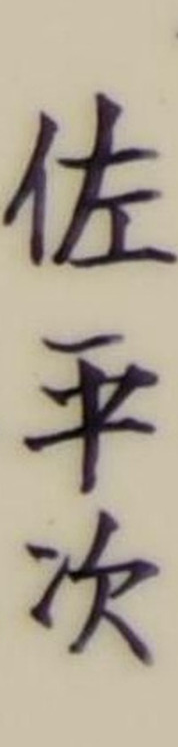佐平次

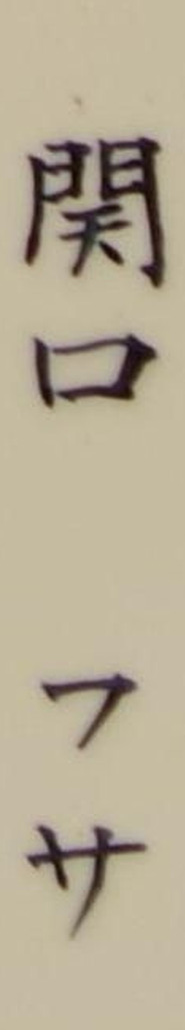関口フサ
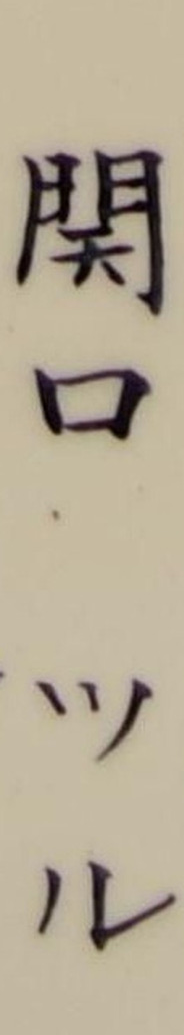関口ツル
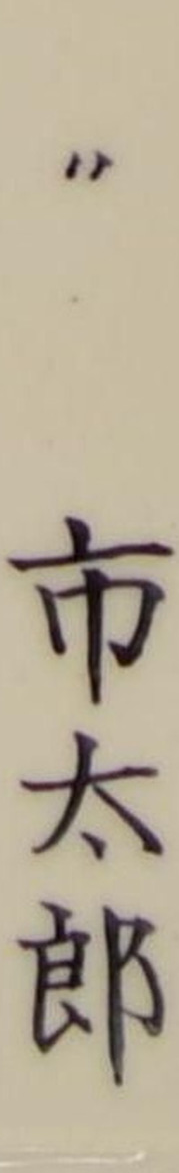市太郎
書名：A~D
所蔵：koyasan kongobuji
